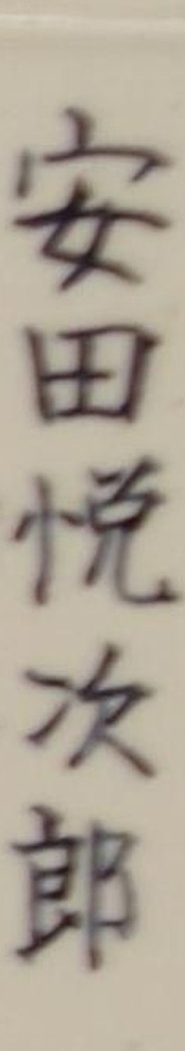安田悦次郎
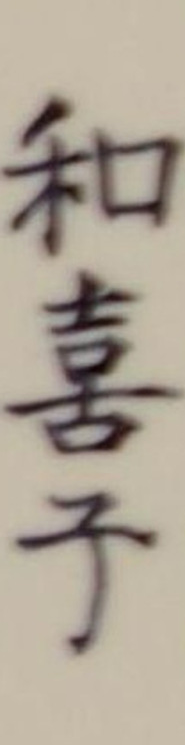和喜子
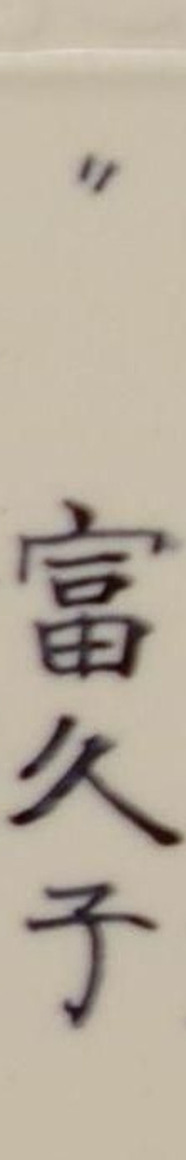富久子
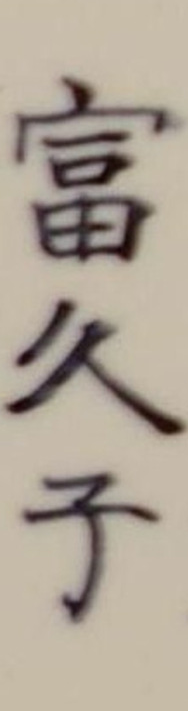富久子

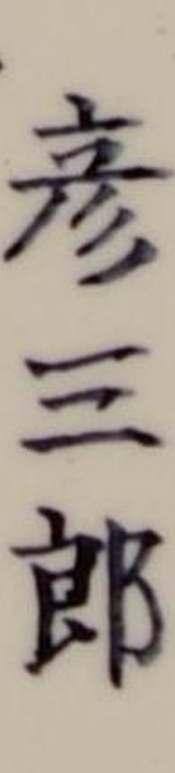彦三郎
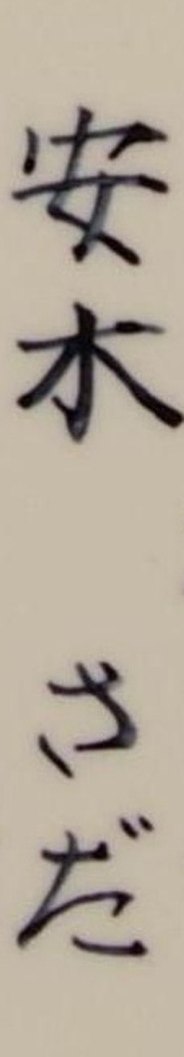安木さだ
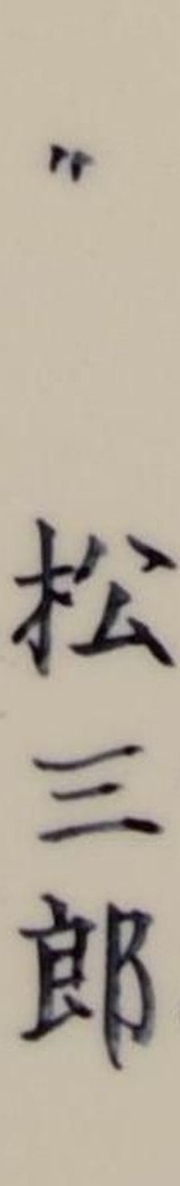松三郎
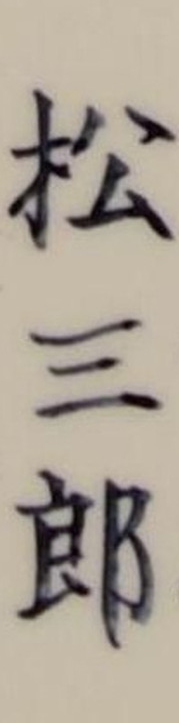松三郎
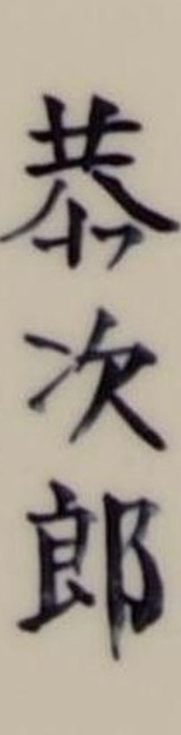恭次郎
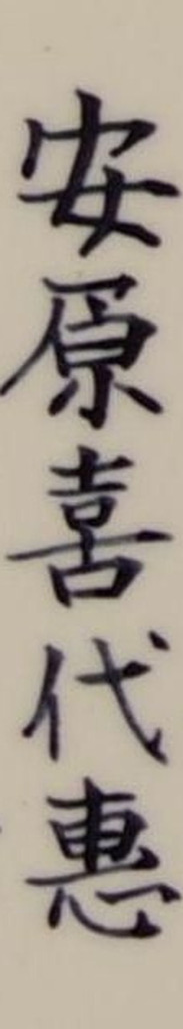安原喜代恵
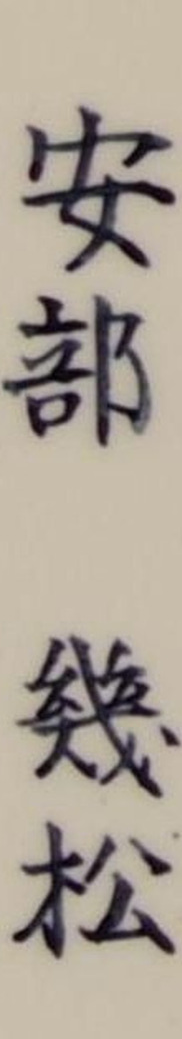安部幾松
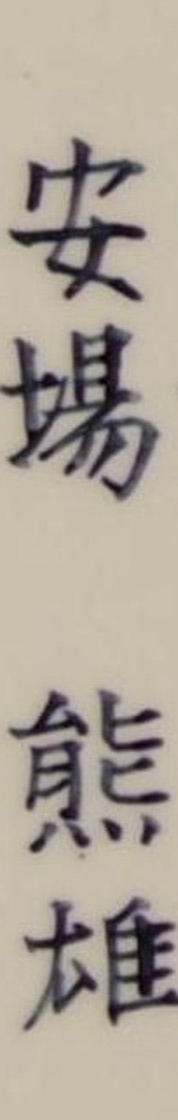安場熊雄

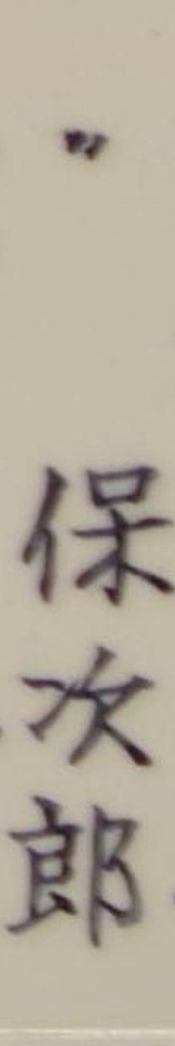保次郎
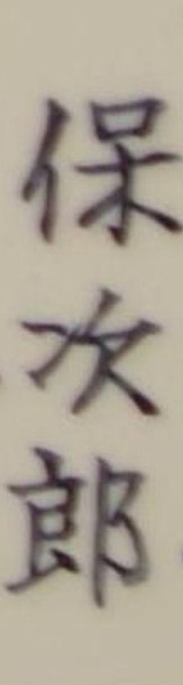保次郎
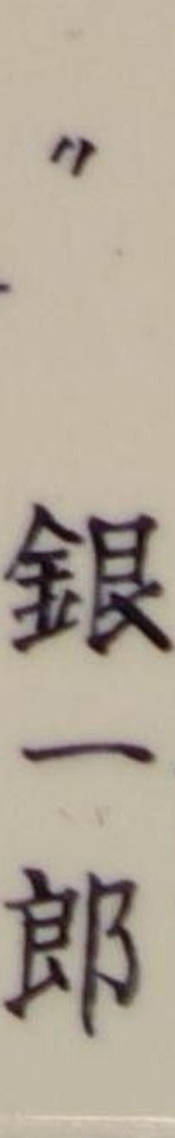銀一郎
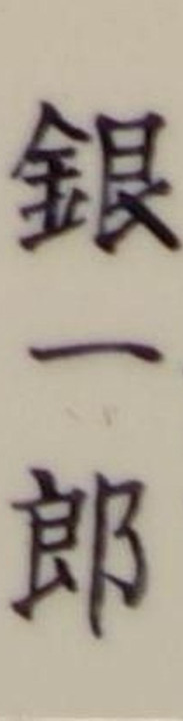銀一郎
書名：M~S
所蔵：高野山金剛峯寺
